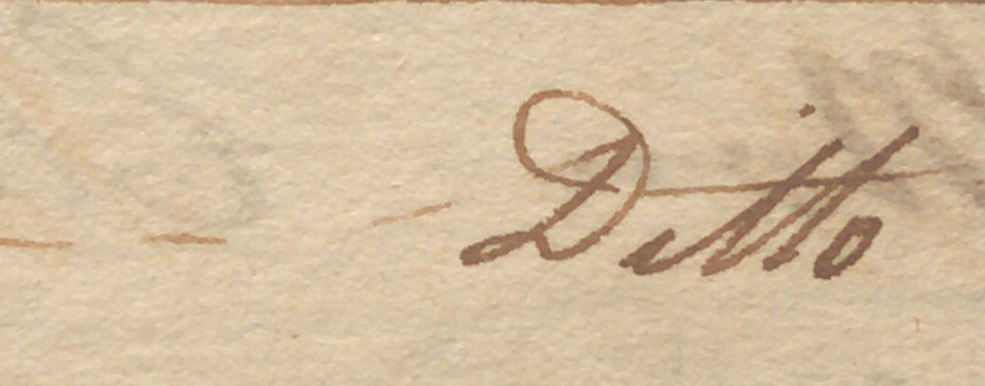Ditto
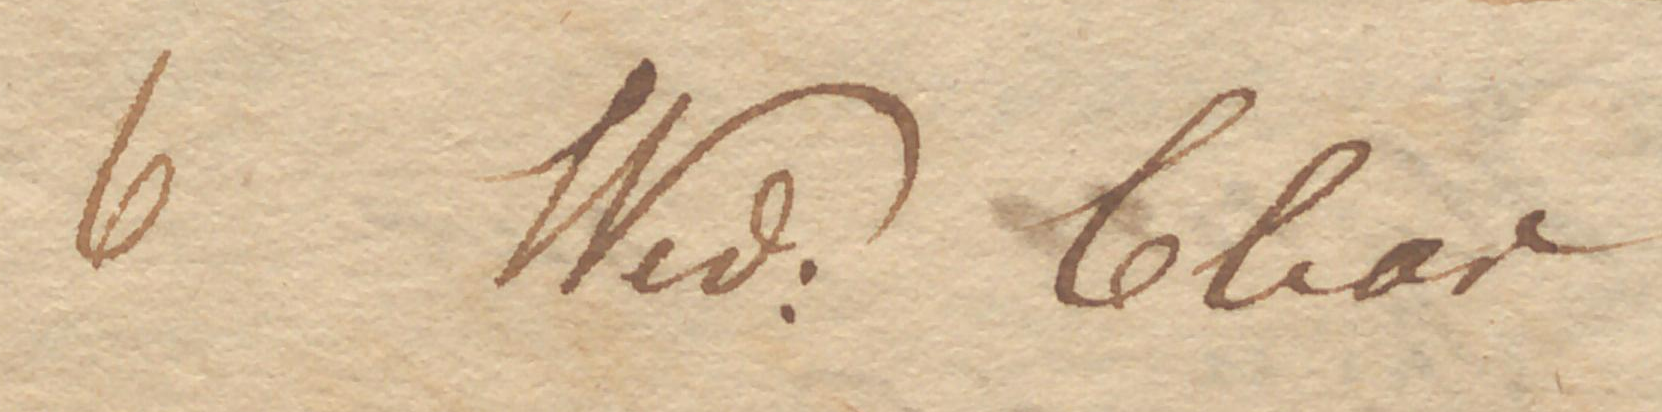6 Wed. Clear
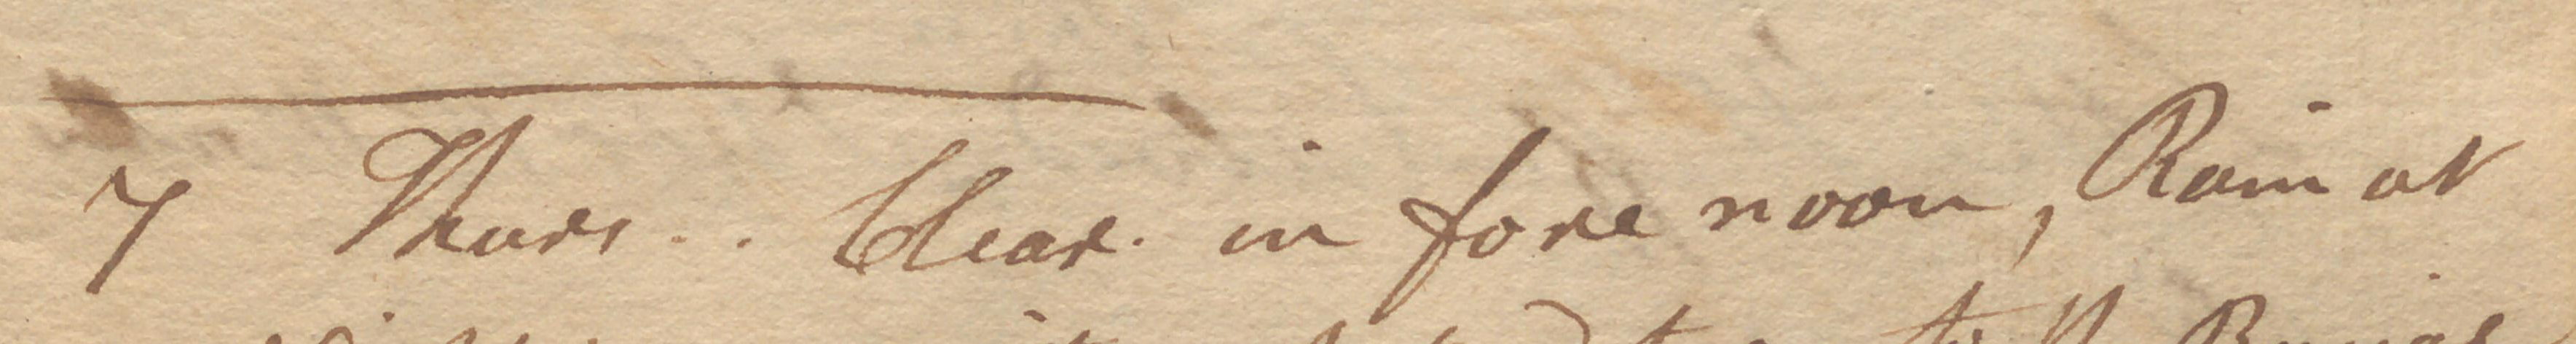7 Thurs.. Clear in fore noon, Rain at
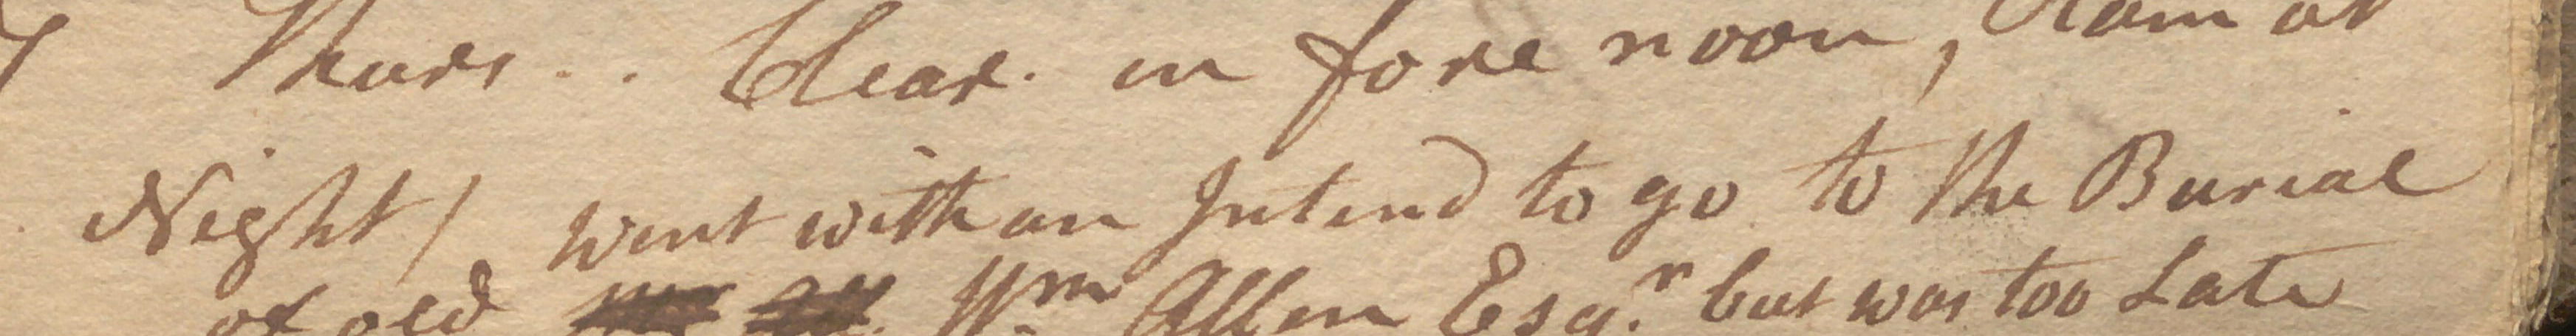Night/ went with an Intend to go to the Burial
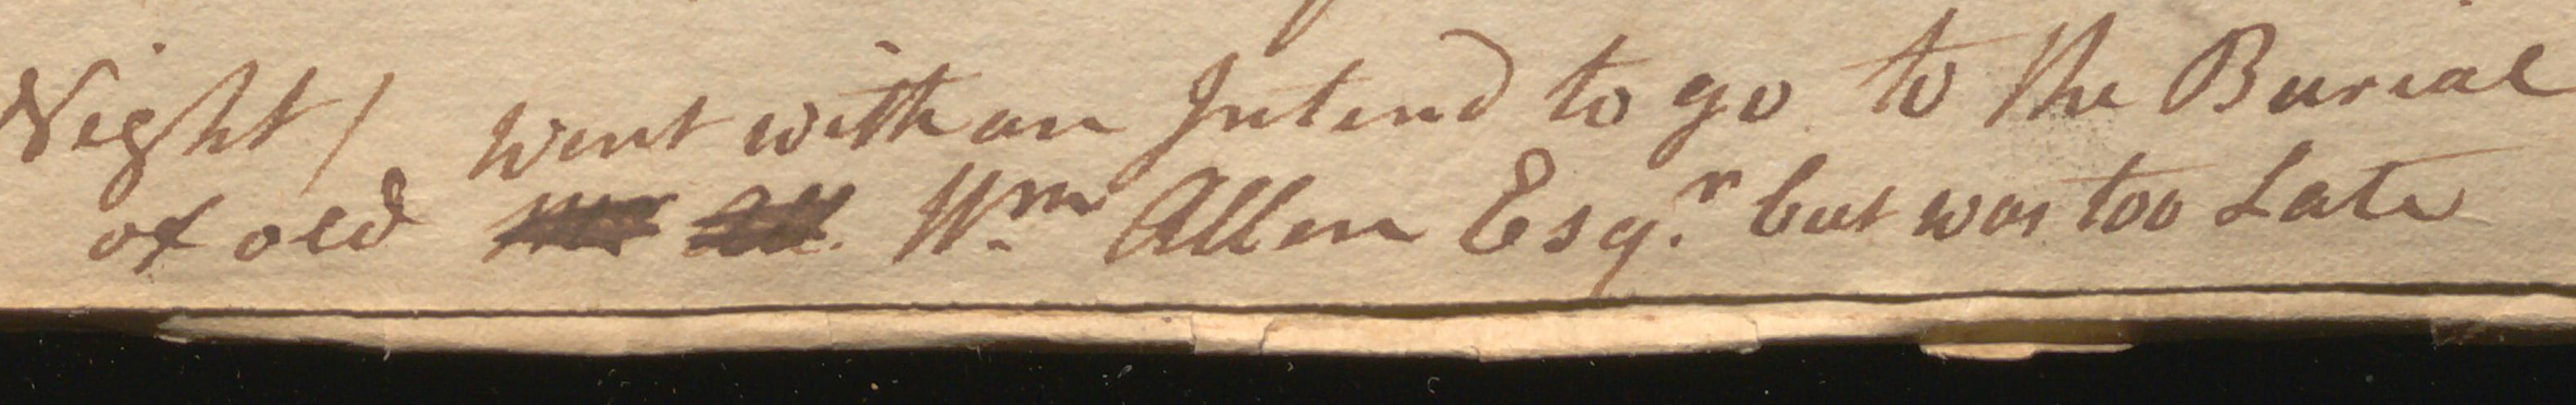of old [M^r] [All] W^m. Allen Esq^r. but was too Late
